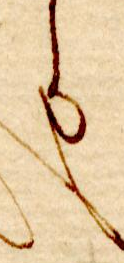To
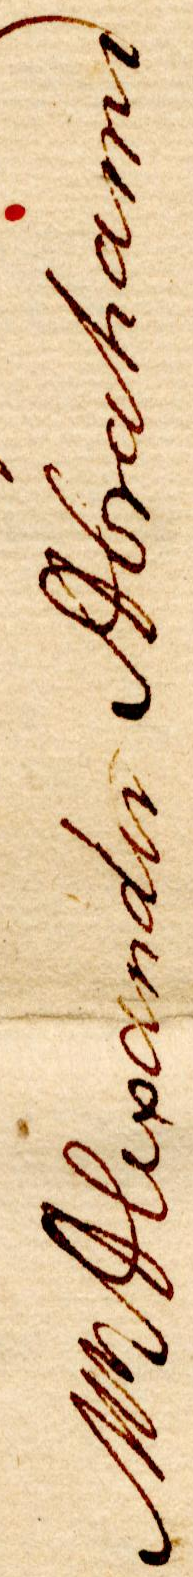M^r Alexander Abraham
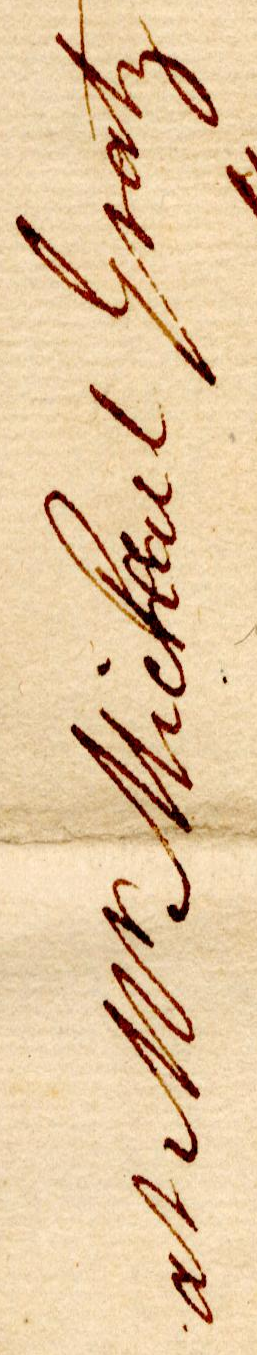at M^r Michael Gratz
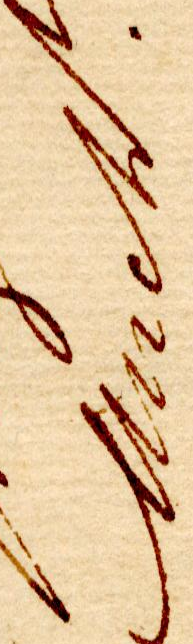Merch^t
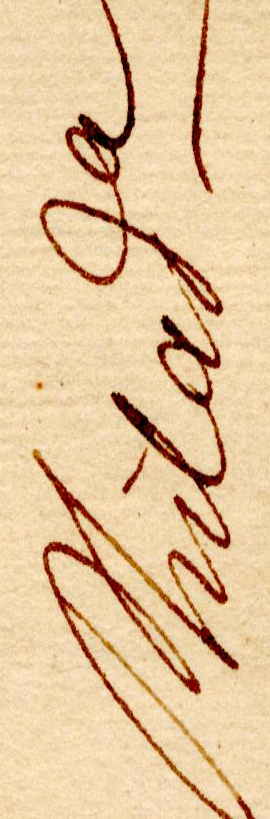Philad^a
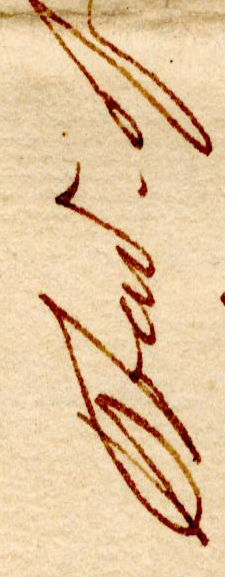per Fav^r of
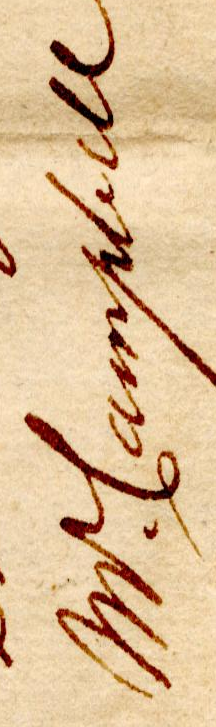M^r. Campbell
